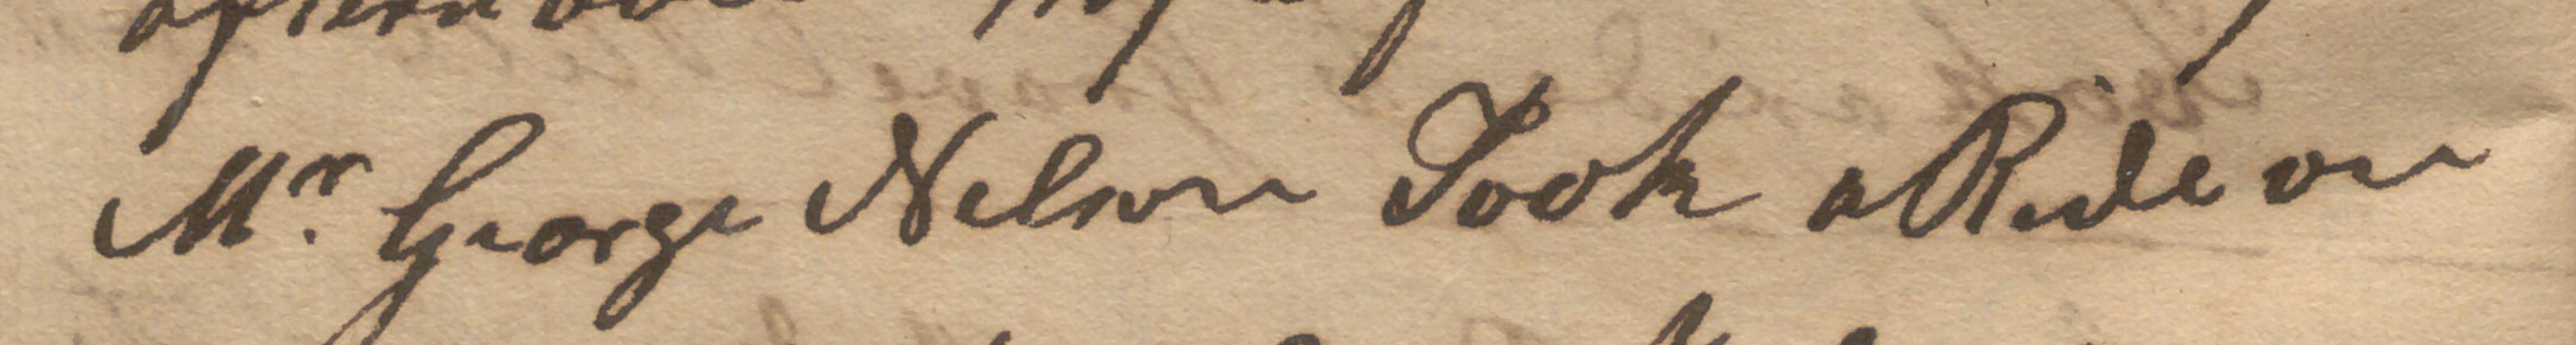M^r. Grorge Nelson Took a Ride on
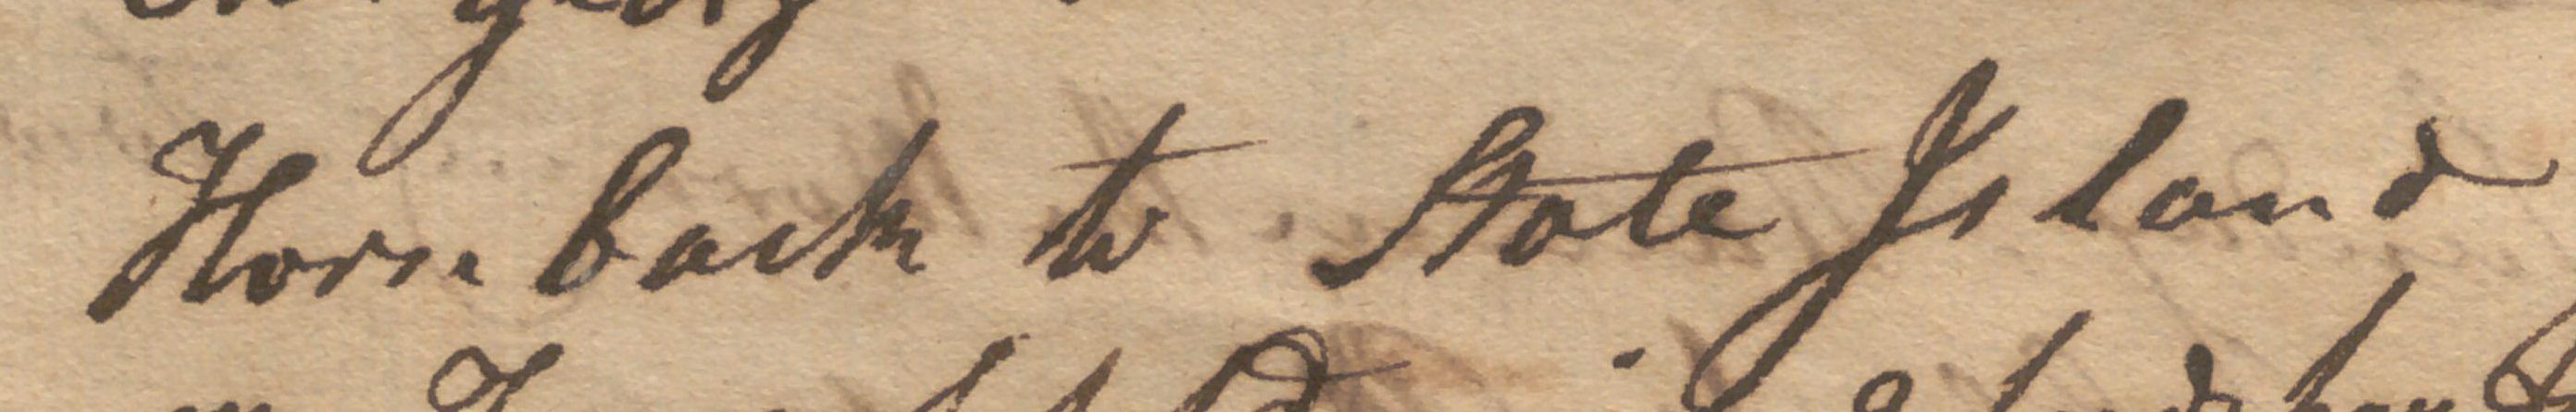Horseback to State Island
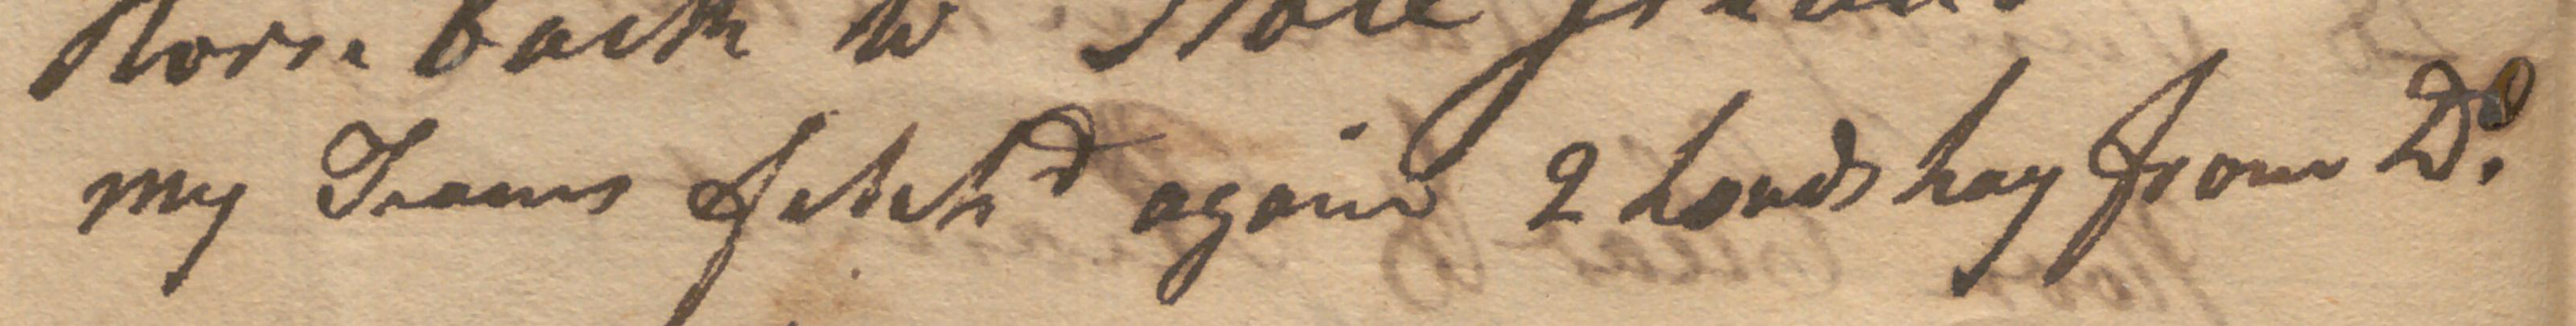my Teams of fetch^d again 2 Loads hay from D^o.
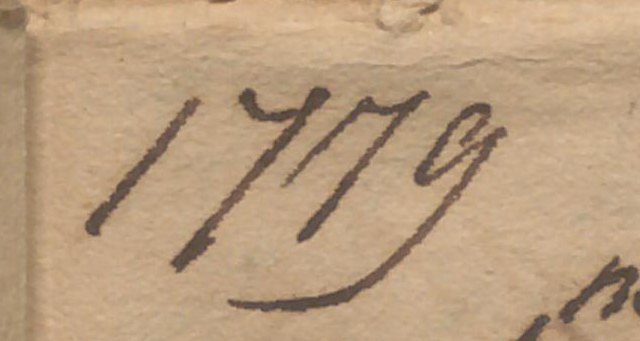1779
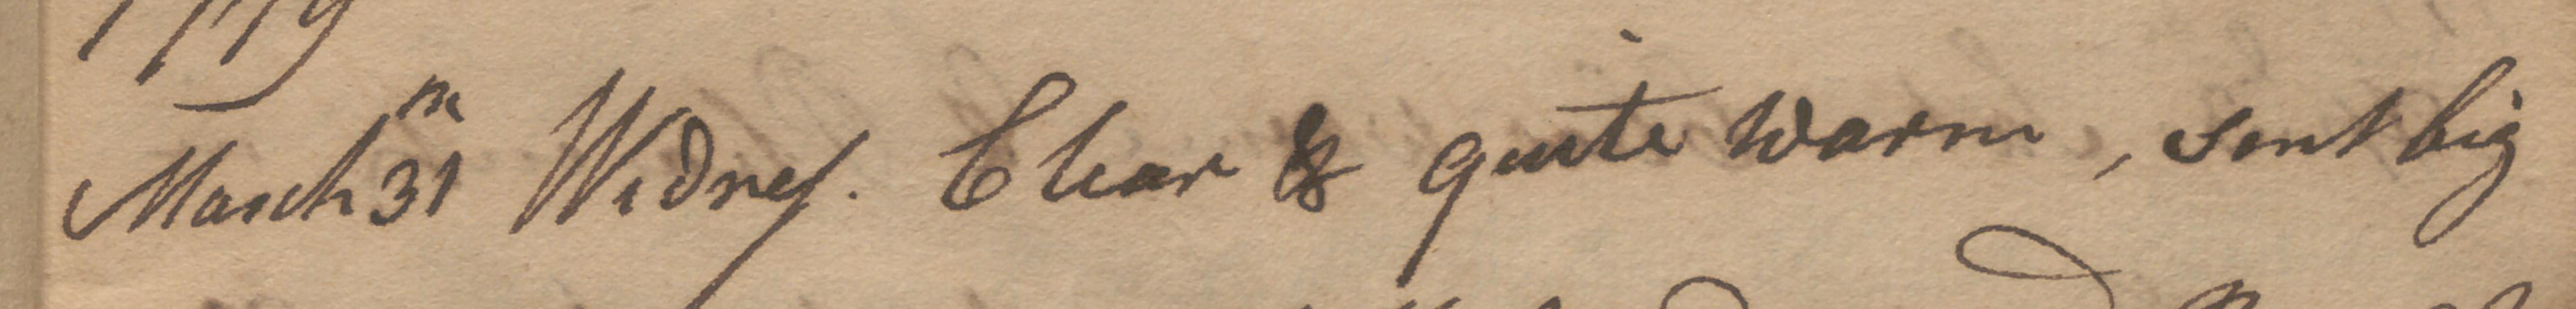March 31^th Wednes. Clear & quite warm, sent big
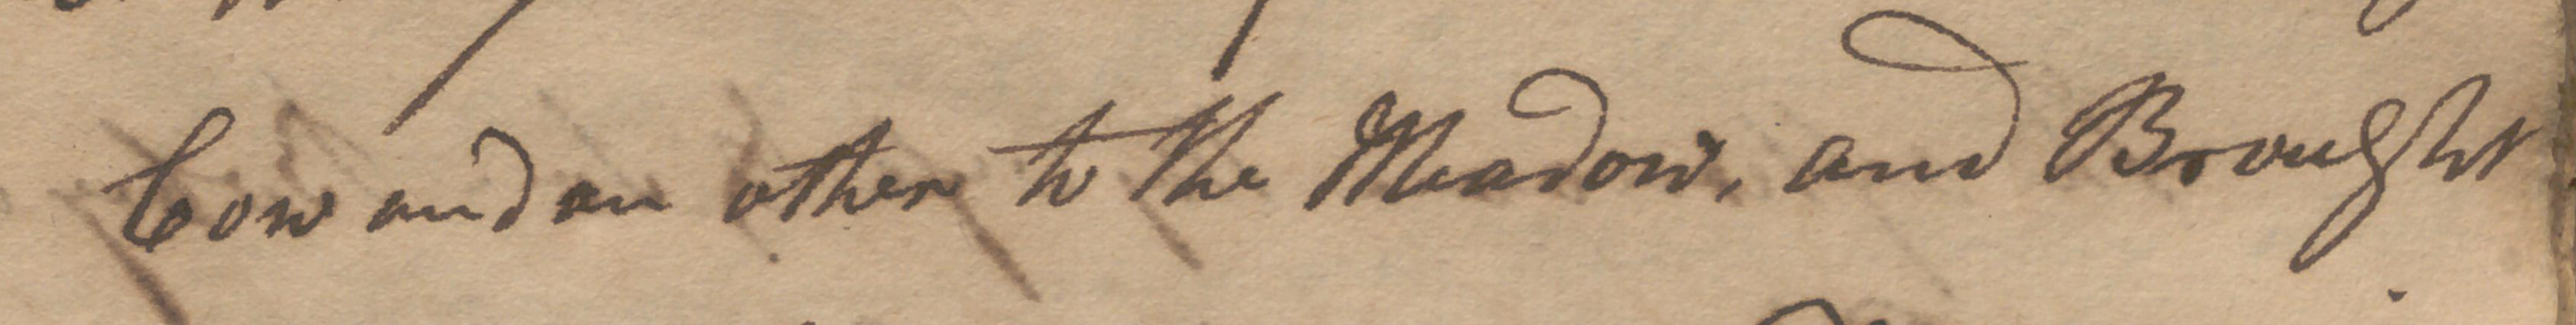Cow and an other to the Meadow and Brought
